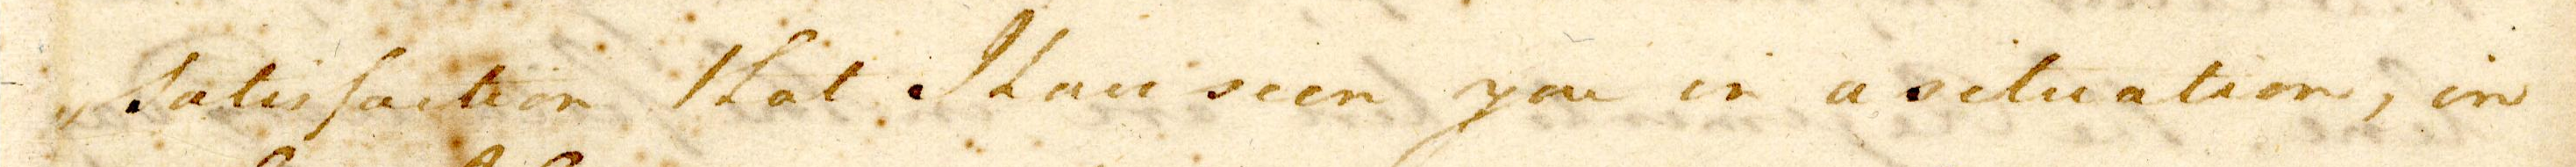Satisfaction that I have seen you in a situation; in
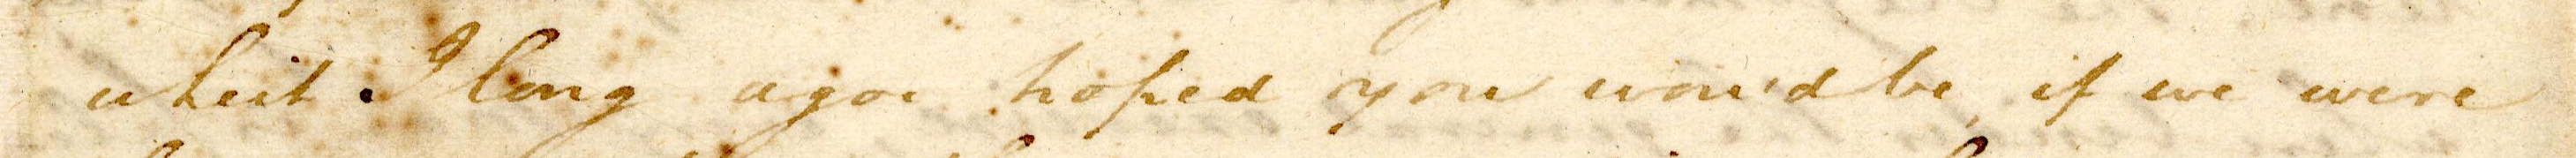which I long ago hoped you wou'd be if we were
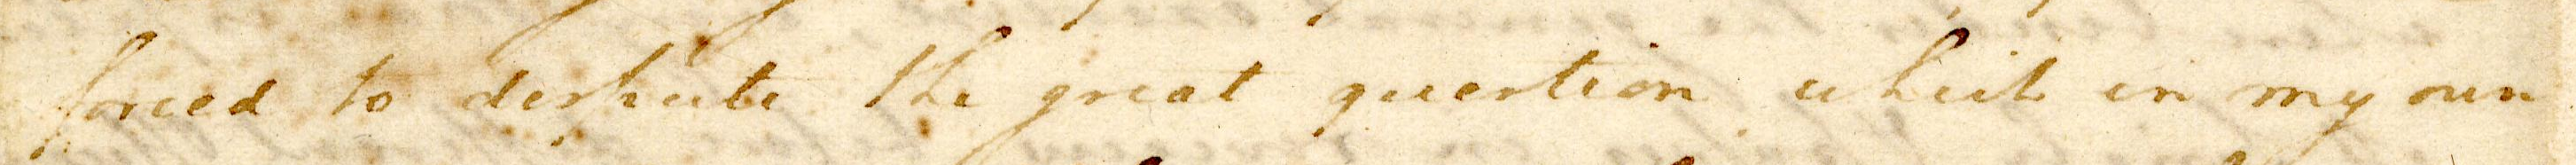forced to dispute the great question which in my own
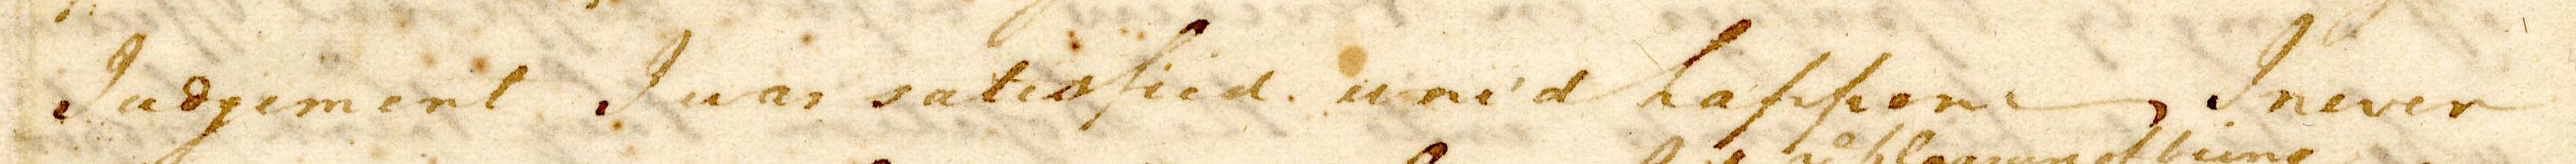Judgement I was satisfied wou'd happen- I never
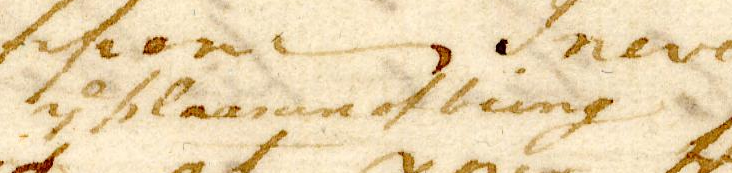y^e pleasure of being
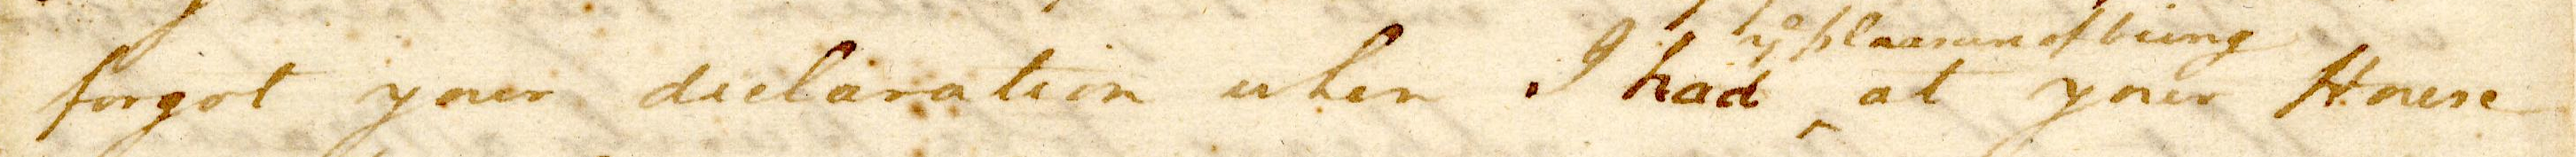forgot your declaration when I had ^ at your House
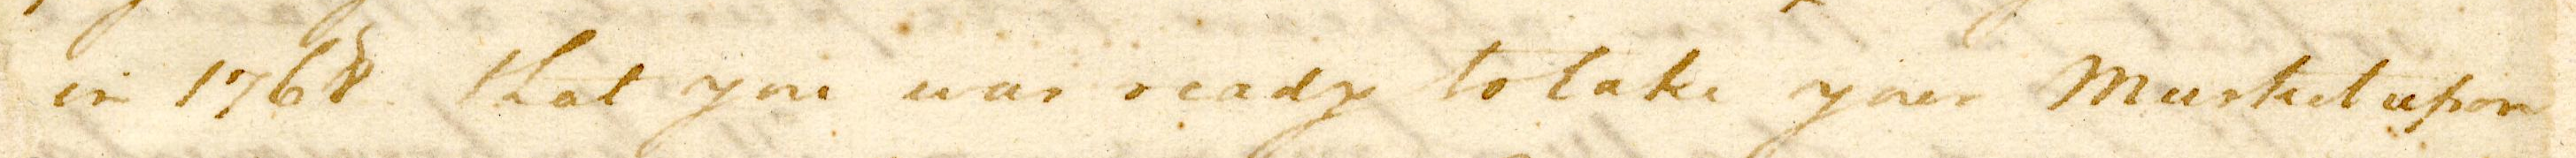in 1768 that you was ready to take your Musket upon
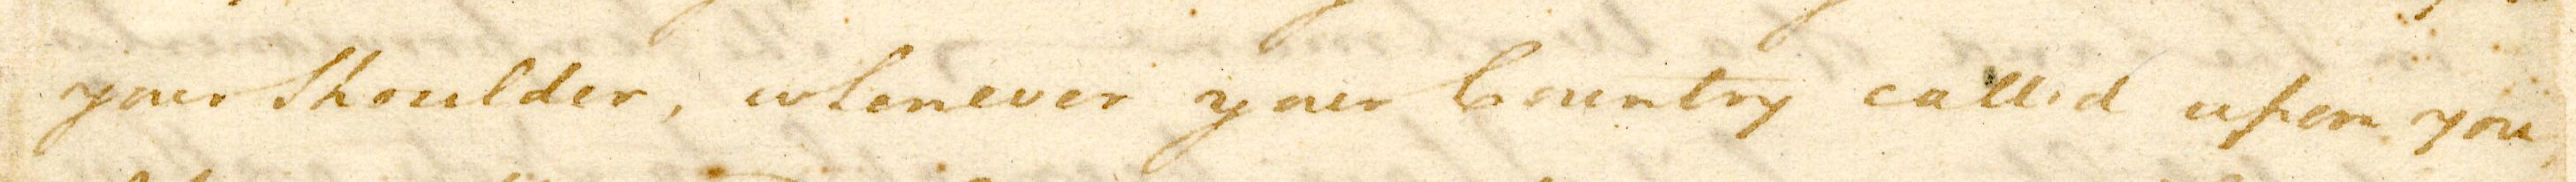your Shoulder, whenever your Country call'd upon you
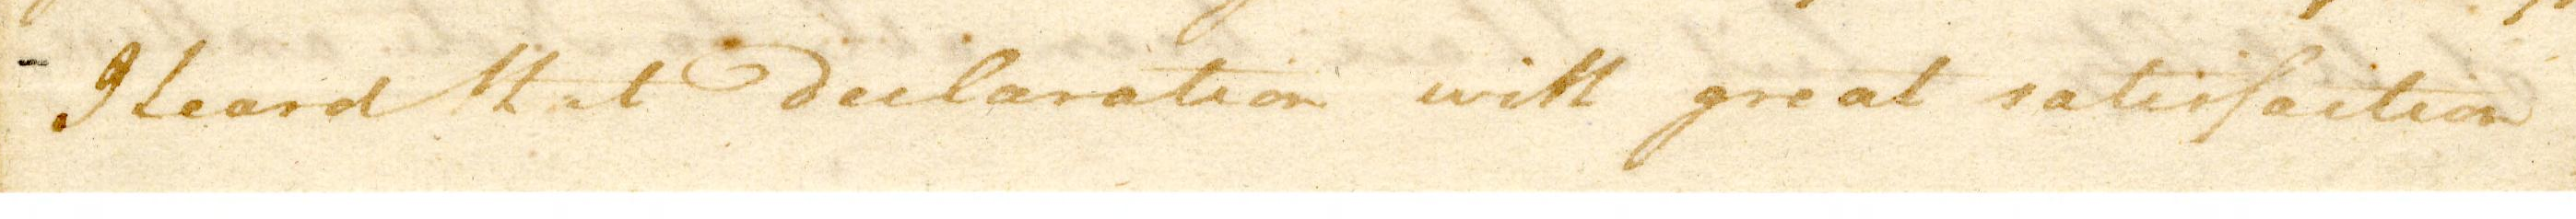I heard that declaration with great satisfaction
